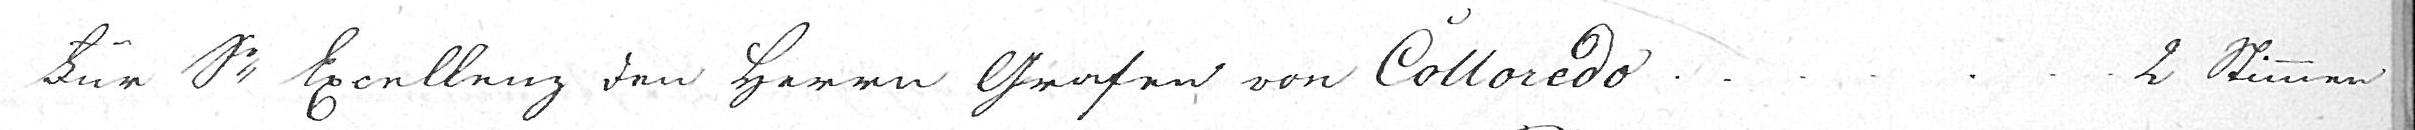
Für Sr. Excellenz den Herrn Grafen von Colloredo . . . . . . . 2 Stimmen
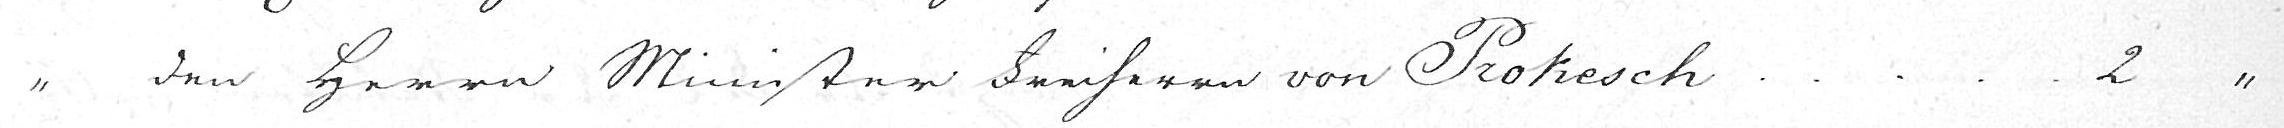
" den Herrn Minister Freiherr von Prokesch . . . . . 2 "
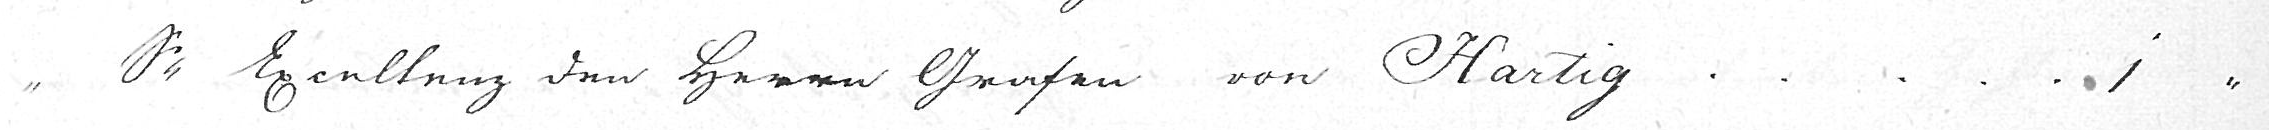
" Sr. Excellenz den Herrn Grafen von Hartig . . . . . 1 "
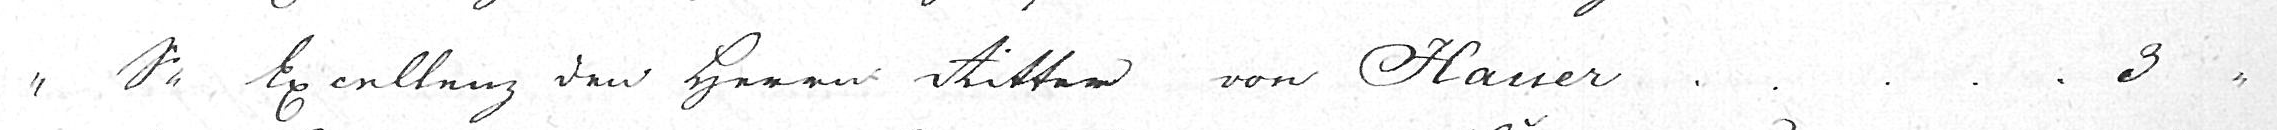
" Sr. Excellenz den Herrn Ritter von Hauer . . . . . 3 "
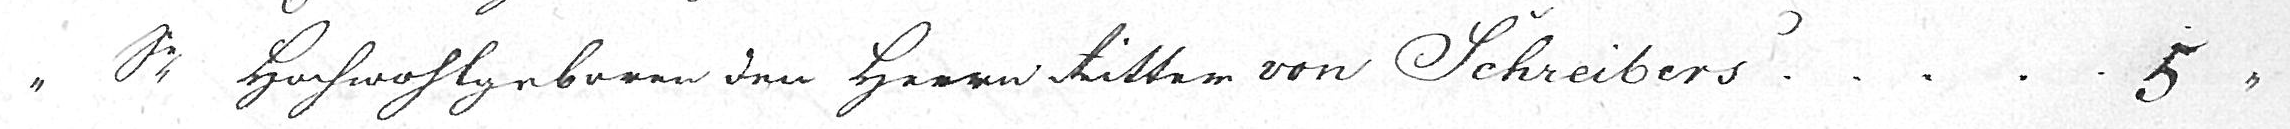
" Sr. Hochwohlgeboren den Herrn Ritter von Schreibers . . . . . 5 "
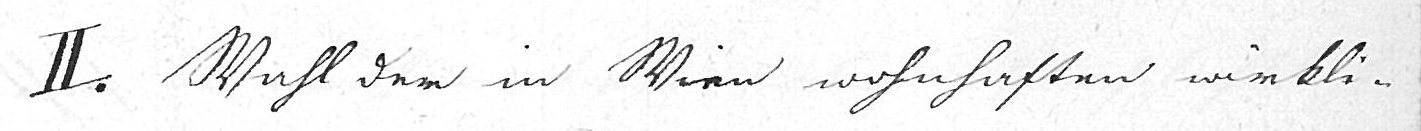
II. Wahl der in Wien wohnhaften wirkli-
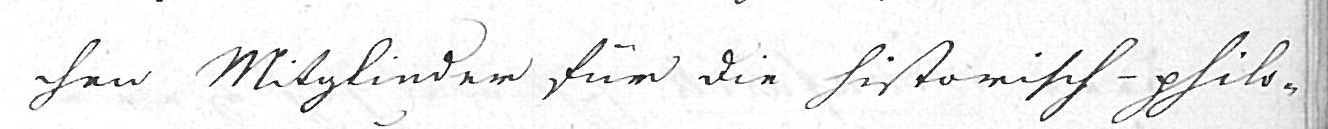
chen Mitglieder für die historisch-philo-
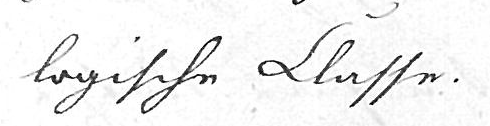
logische Classe
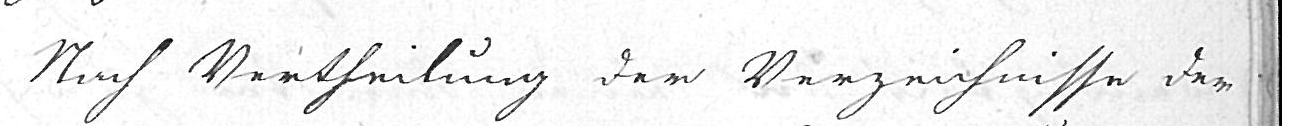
Nach Vertheilung der Verzeichnisse der
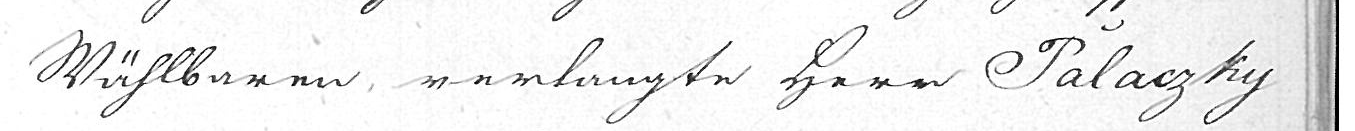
Wählbaren, verlangte Herr Palaczky
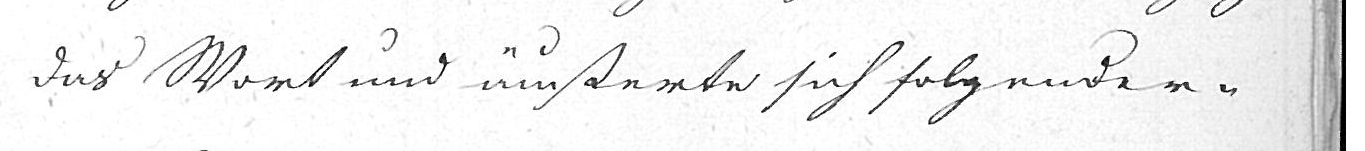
das Wort und äußerte sich folgender-
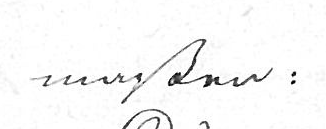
maßen:
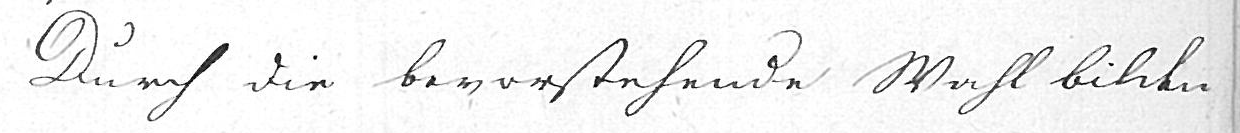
Durch die bevorstehende Wahl bilden
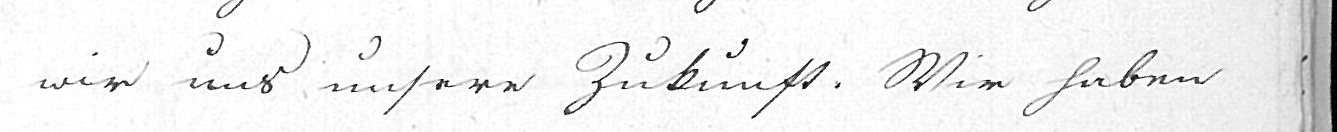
wir uns unsere Zukunft. Wir haben
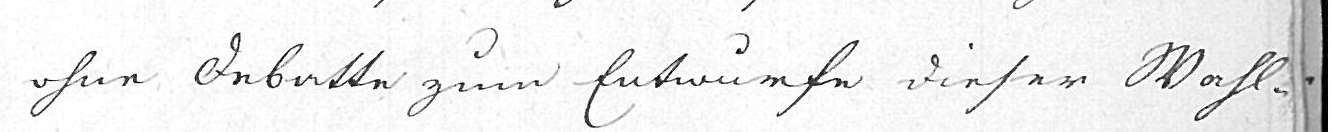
ohne Debatte zum Entwurfe dieser Wahl-
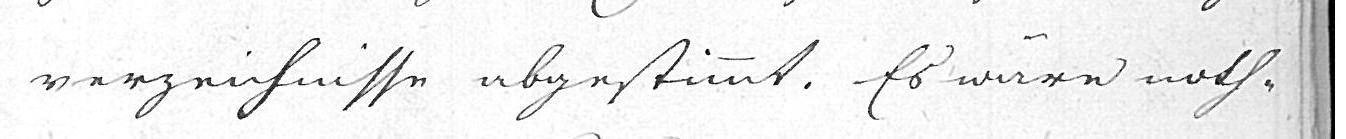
verzeichnisse abgestimmt. Es wäre noth-
